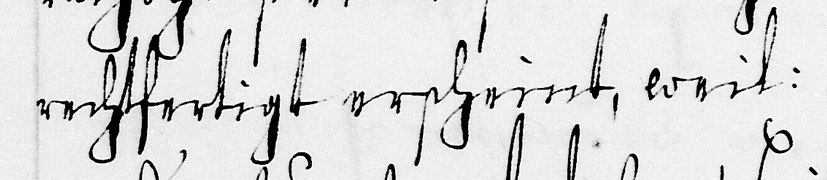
erechtfertigt erscheint, weil:
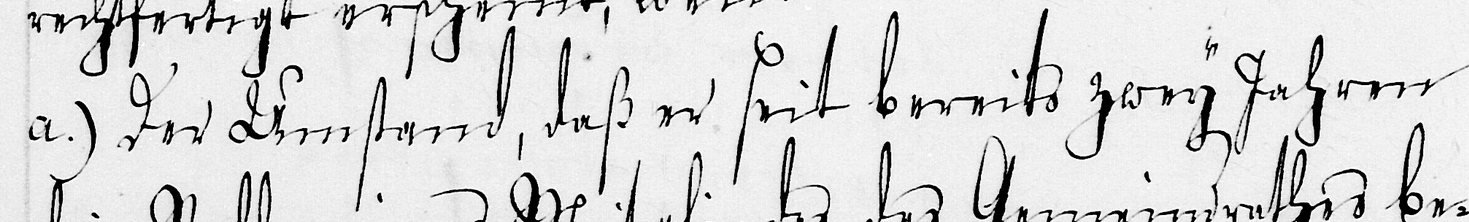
a.) Der Umstand, daß er seit bereits zwey Jahren
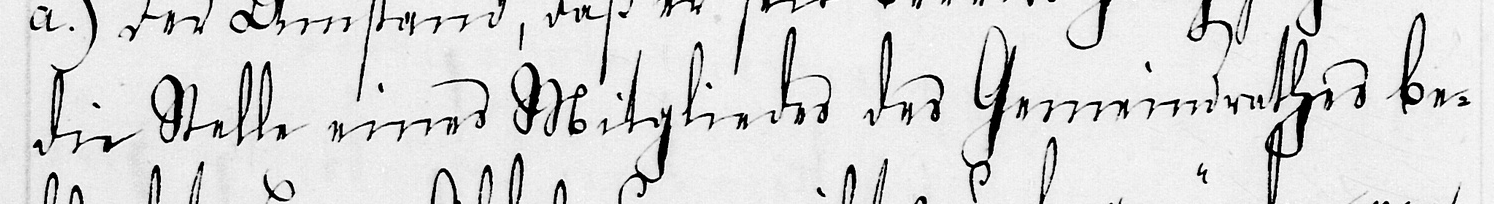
die Stelle eines Mitgliedes des Gemeindrathes be¬
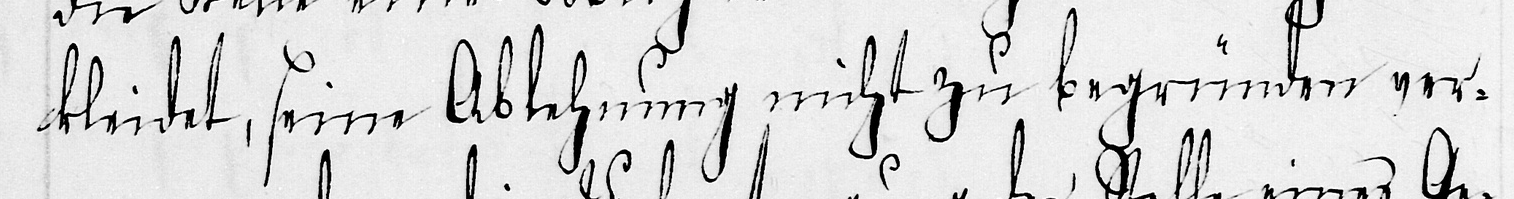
kleidet, seine Ablehnung nicht zu begründen ver¬
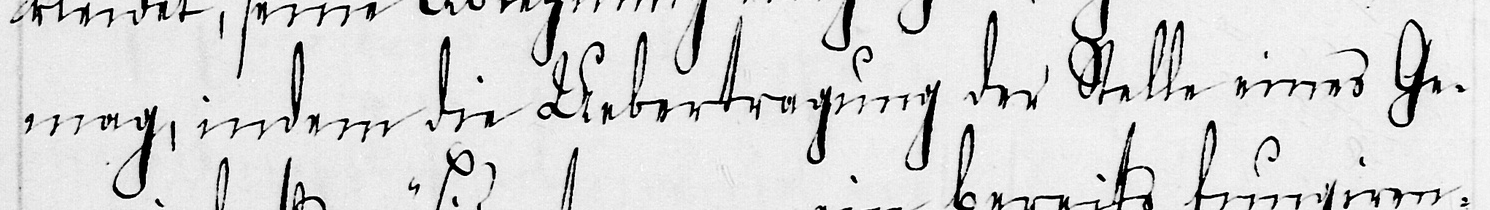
mag, indem die Uebertragung der Stelle eines Ge¬
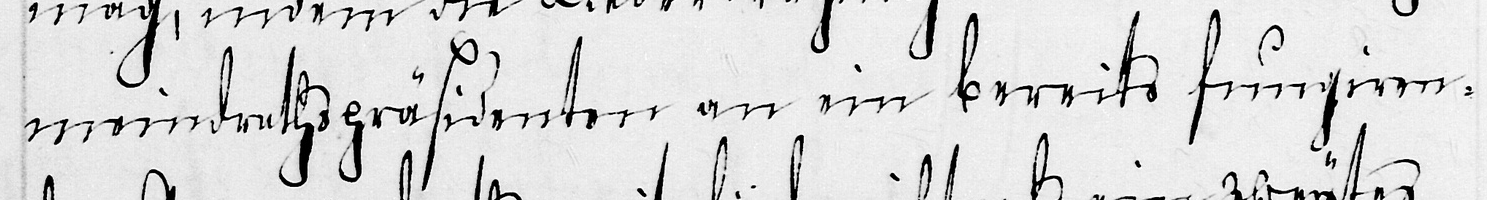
meindrathspräsidenten an ein bereits fungiren¬
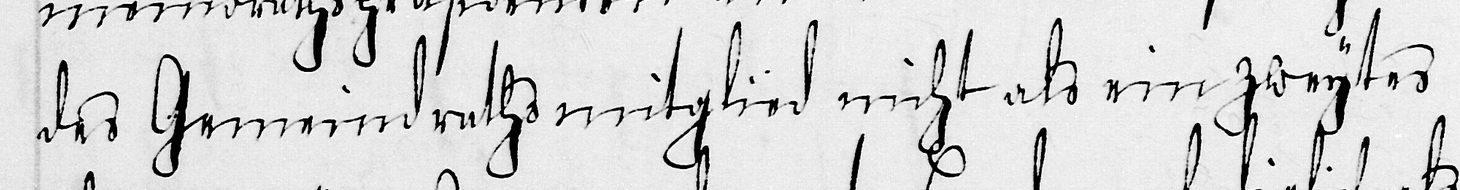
des Gemeindrathsmitglied nicht als ein zweytes
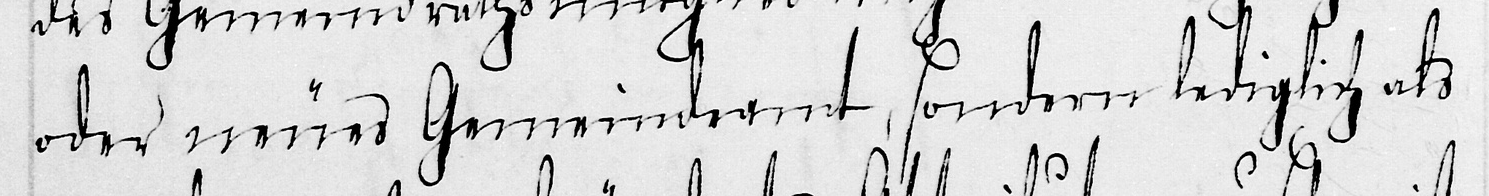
oder neues Gemeindeamt, sondern lediglich als
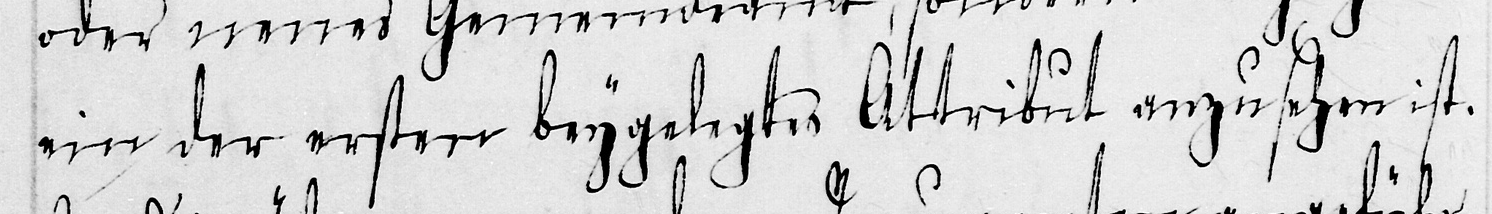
ein der ersten beygelegtes Attribut anzusehen ist.
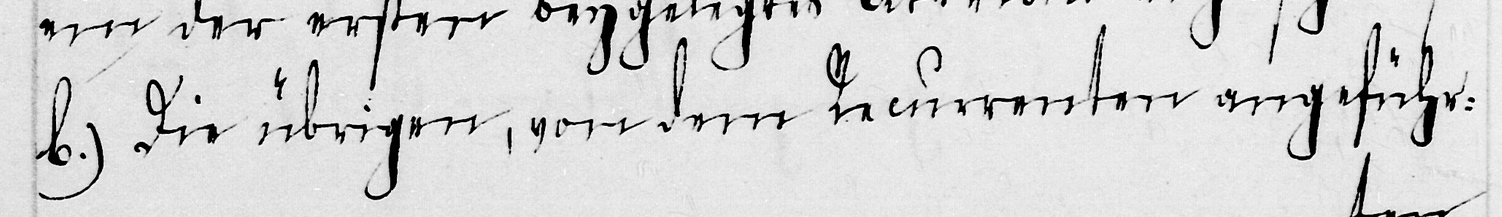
b.) Die übrigen, von dem Recurrenten angeführ-
